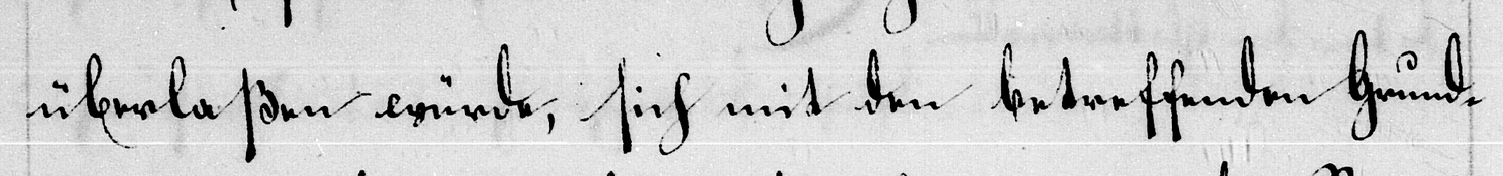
überlaßen würde, sich mit den betreffenden Grund¬
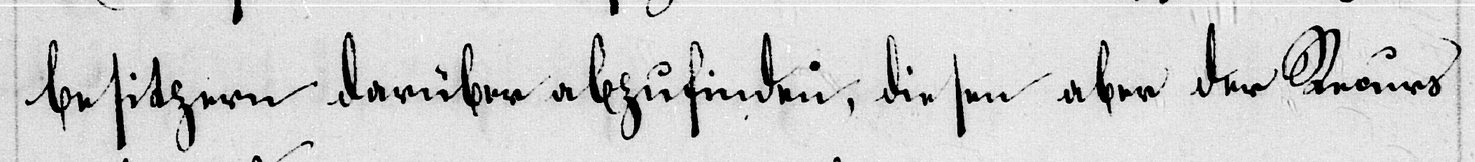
besitzern darüber abzufinden, diesen aber der Recurs
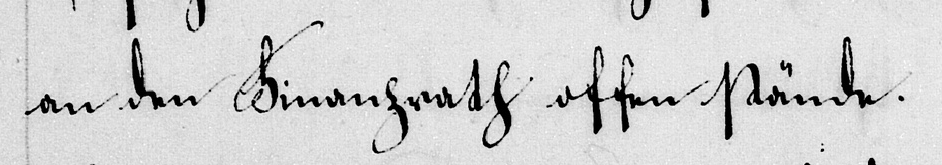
an den Finanzrath offen stände.
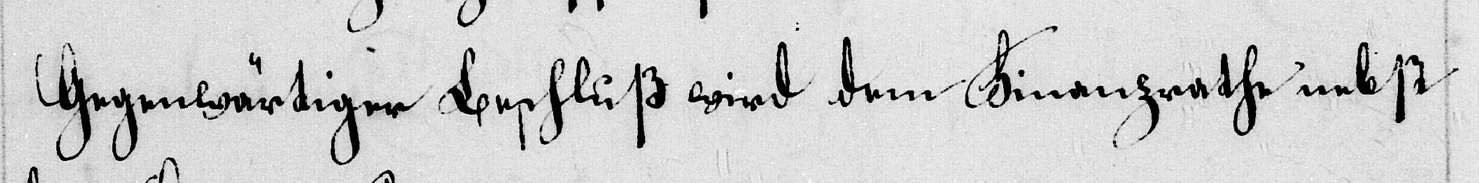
Gegenwärtiger Beschluß wir dem Finanzrathe nebst
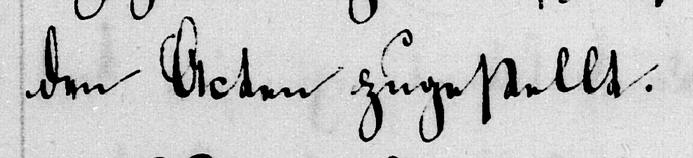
den Acten zugestellt.
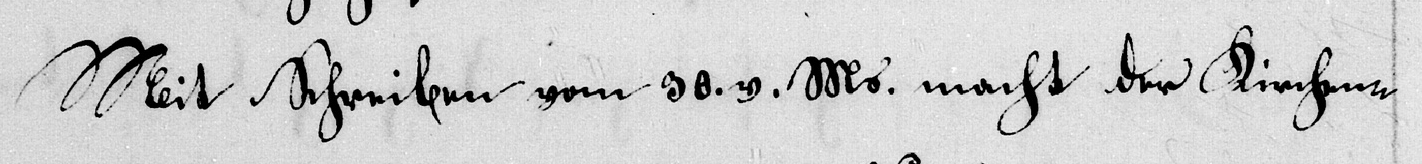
Mit Schreiben vom 30. v. Ms. macht der Kirchen¬
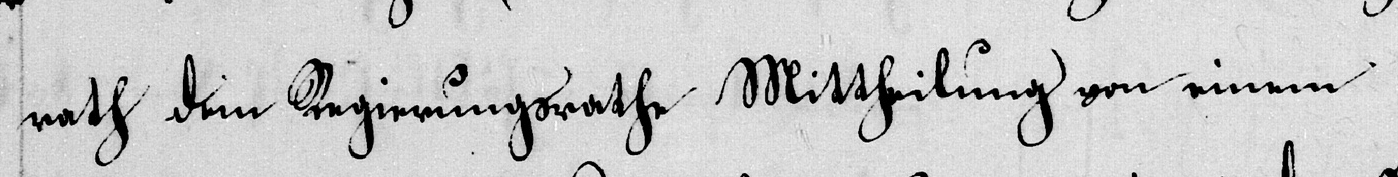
rath dem Regierungsrath Mitteilung von einem
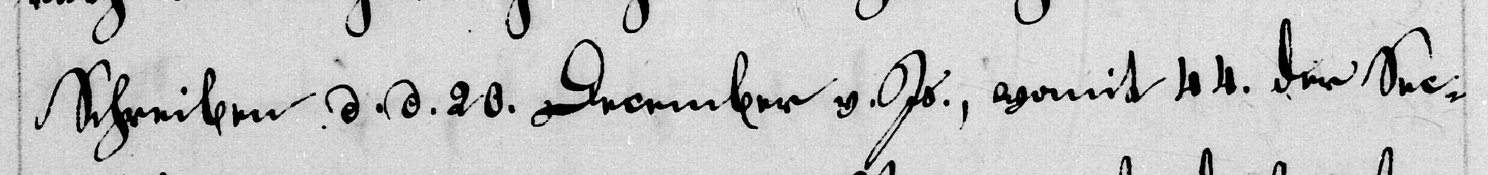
Schreiben d. d. 20. December v. Js., womit 44. der Sec¬
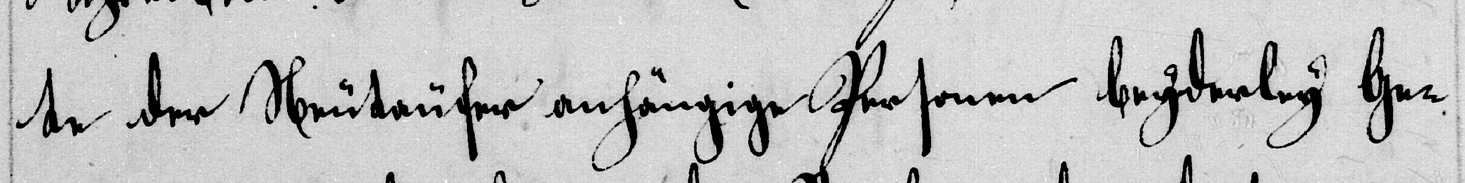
te der Neutäufer anhängige Personen beyderley Ge¬
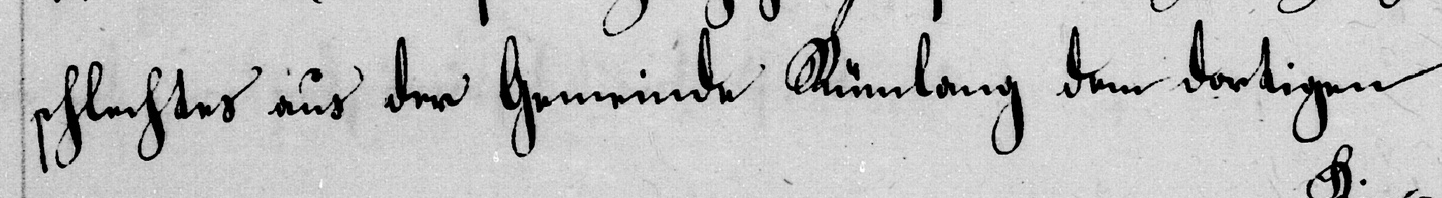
schlechtes aus der Gemeinde Rümlang dem dortigen
